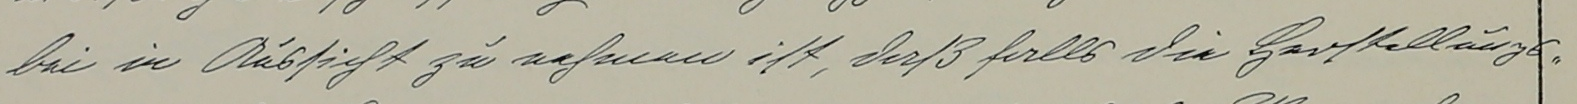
bei in Aussicht zu nehmen ist, daß falls die Herstellungs-
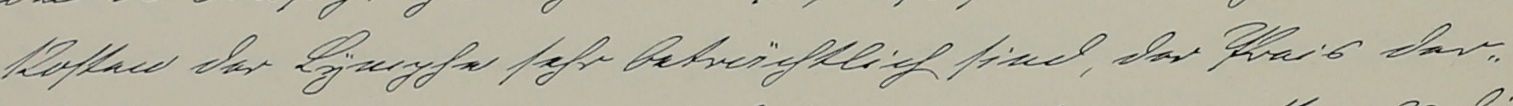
kosten der Lymphe sehr beträchtlich sind, der Preis der-
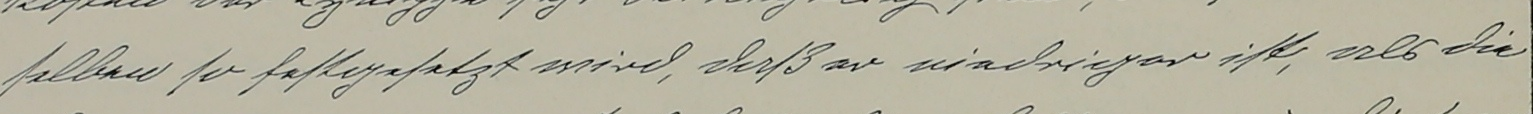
selben so festgesetzt wird, daß er niedriger ist, als die
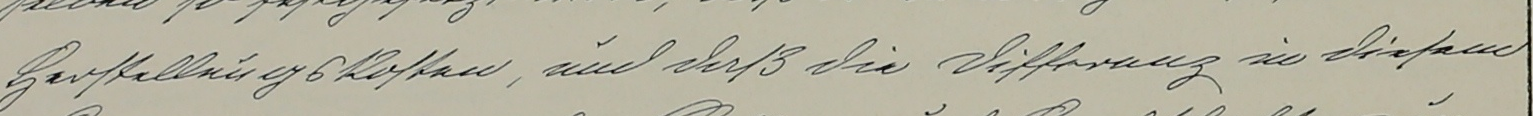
Herstellungskosten, und daß die Differenz in diesem
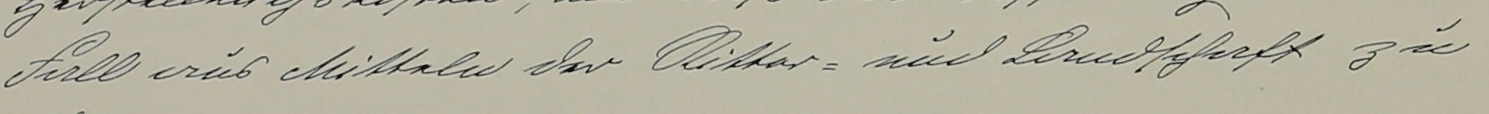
Fall aus Mitteln der Ritter- und Landschaft zu
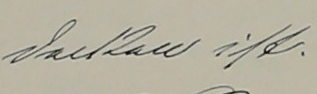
decken ist.
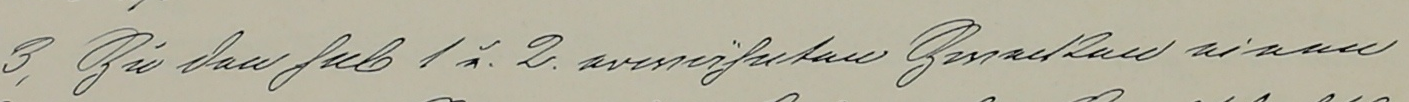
3. Zu den sub 1 u. 2. erwähnten Zwecken einen
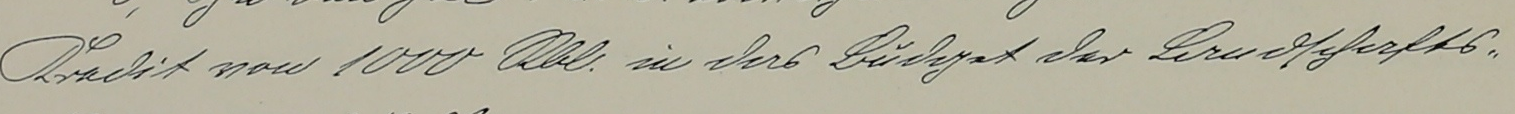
Kredit von 1000 Rbl. in das Budget der Landschafts-
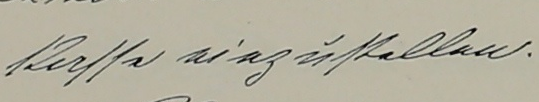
kasse einzustellen.
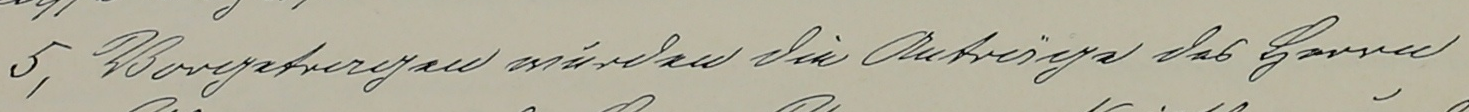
5. Vorgetragen wurden die Anträge des Herrn
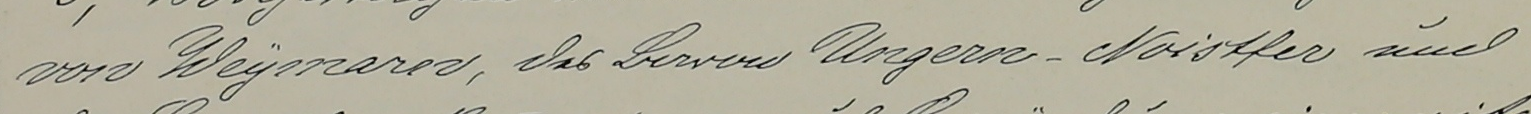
von Weymarn, des Baron Ungern-Noistfer und
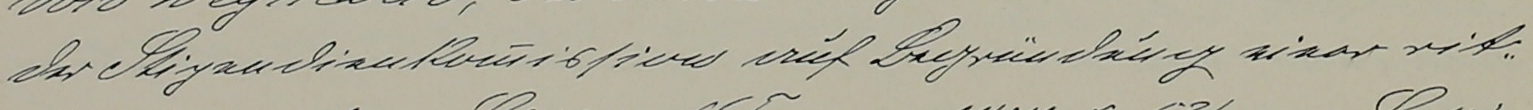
der Stipendienkommission auf Begründung einer rit-
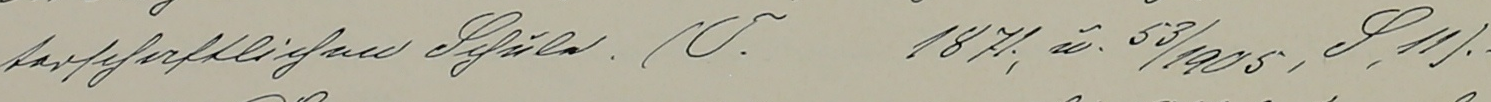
terschaftlichen Schule. (T 1871; u. 53/1905, S.11).
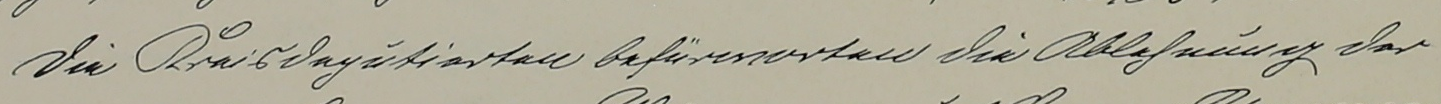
Die Kreisdeputierten befürworten die Ablehnung der
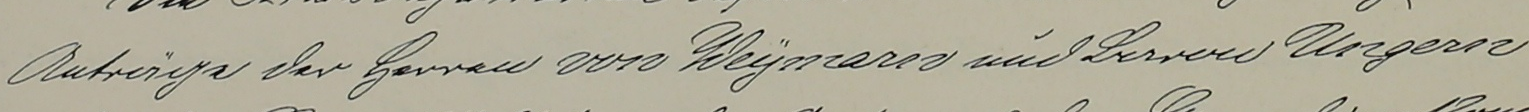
Anträge der Herren von Weymarn und Baron Ungern
